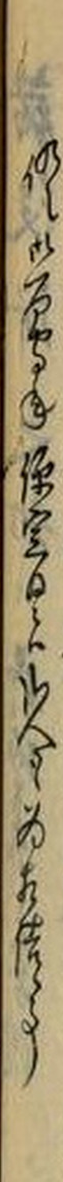仍之御留守年評定日には弐人ツヽ為相詰候事
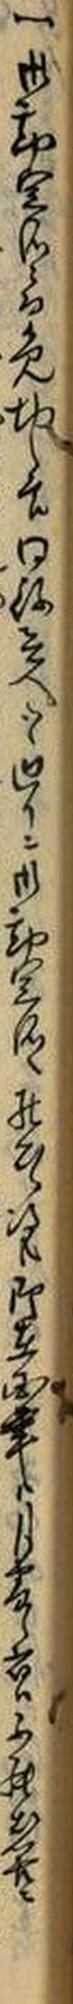一御勘定所にて免切之節同役壱人ツヽ廻りに御勘定所へ罷出候得共御在国年は月番之者は不罷出筈に
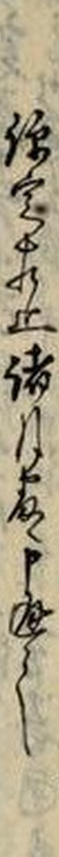評定相止諸月番へ申通之
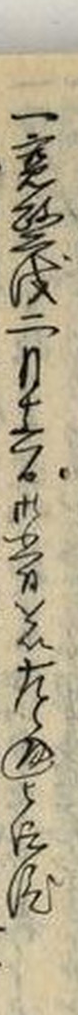一寛政二戌二月十六日御書付を以左之通被仰渡
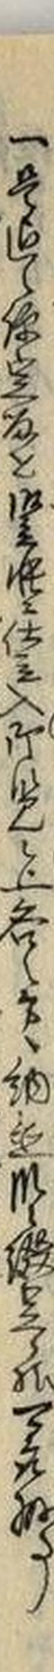一是迄之評定留を竪帳に仕立入御覧候上各々方へ納置段々綴足候様可取扱事
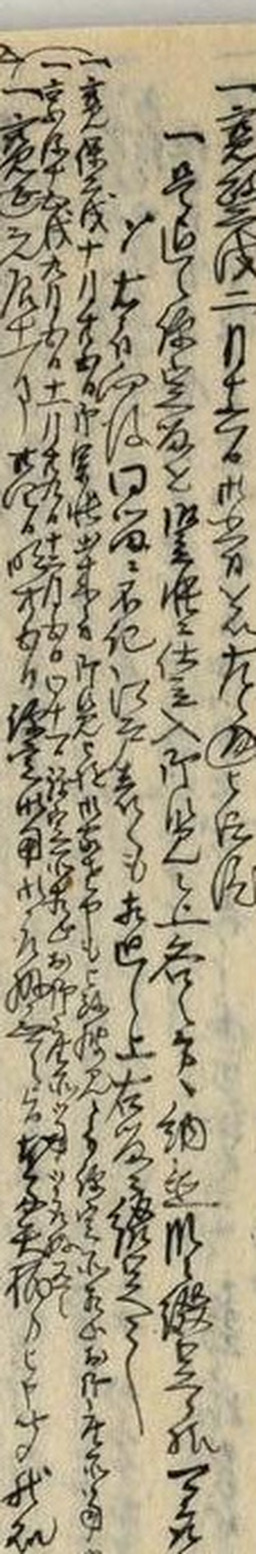〆右に付向後同留に不記江戸表へも相廻之上右留に綴足之
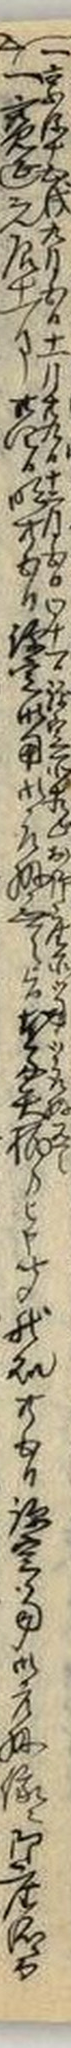一寛延元辰十一月廿四日明廿五日評定御用御取扱無之旨本多矢柄方被申聞然処廿五日評定御用御取扱俄に御座所にて
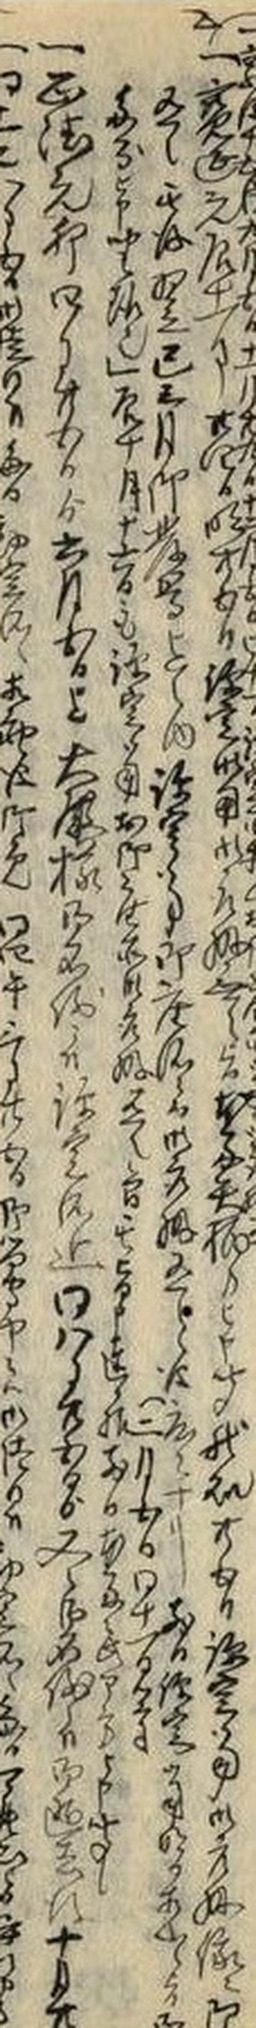多分被申聞候趣也」辰十月十六日にも評定御用於御座所御取扱有之候間其旨申達候様前日本多民部方被申聞候
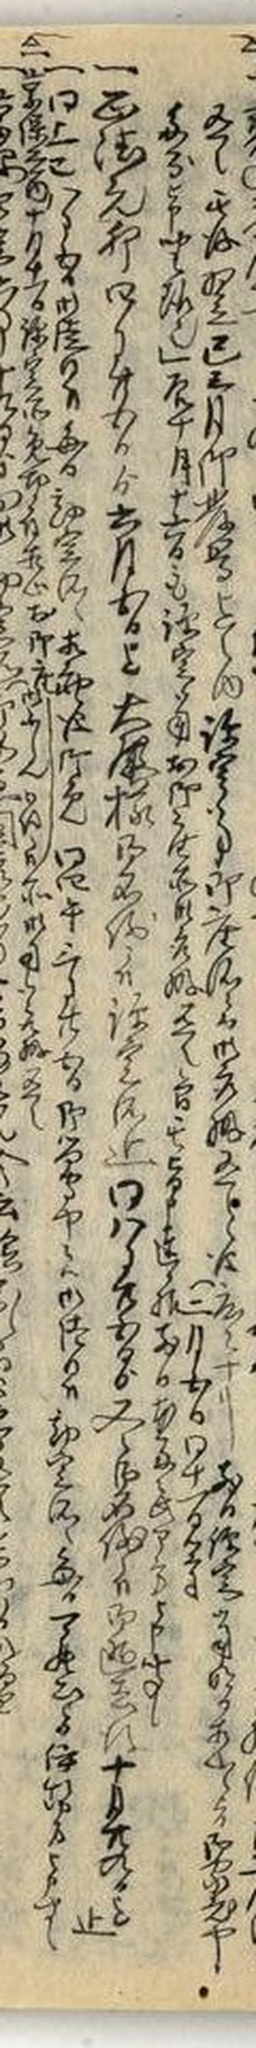一正徳元卯四月廿五日ゟ六月五日迄大殿様御不例に付評定所止同八月廿五日ゟ又々御不例に付御逝去後十月廿九日迄止
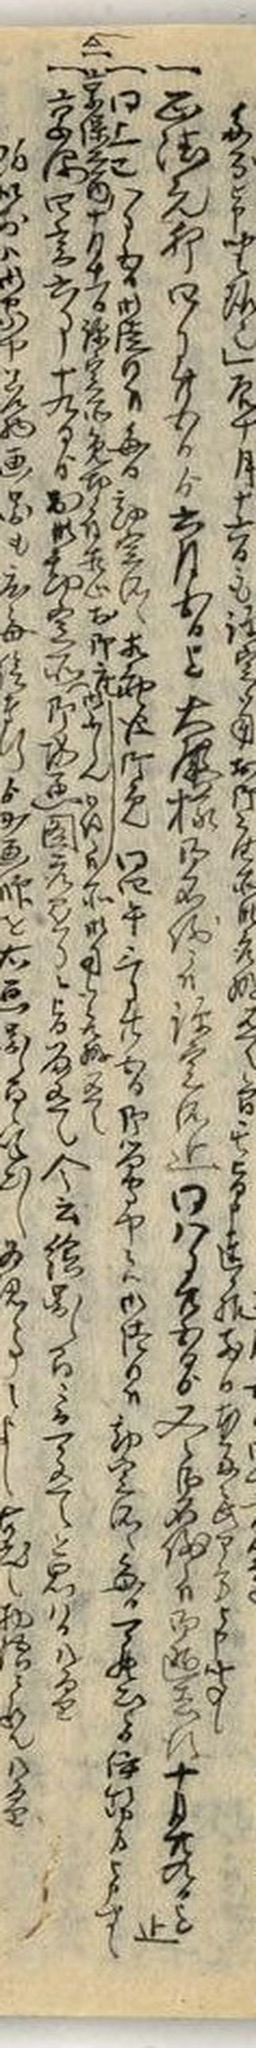一同三巳八月五日御徒目付毎日勘定所へ相勤候儀御免同四午三月廿五日御留守中には御徒目付勘定所へ毎日可罷出旨伊勢方被申聞候
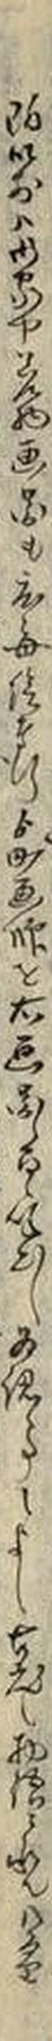附以前は御家中差物画図も度毎絵奉行ゟ町画師を右画図之間へ呼出し為認候事之よし古老之物語に承ル八百里
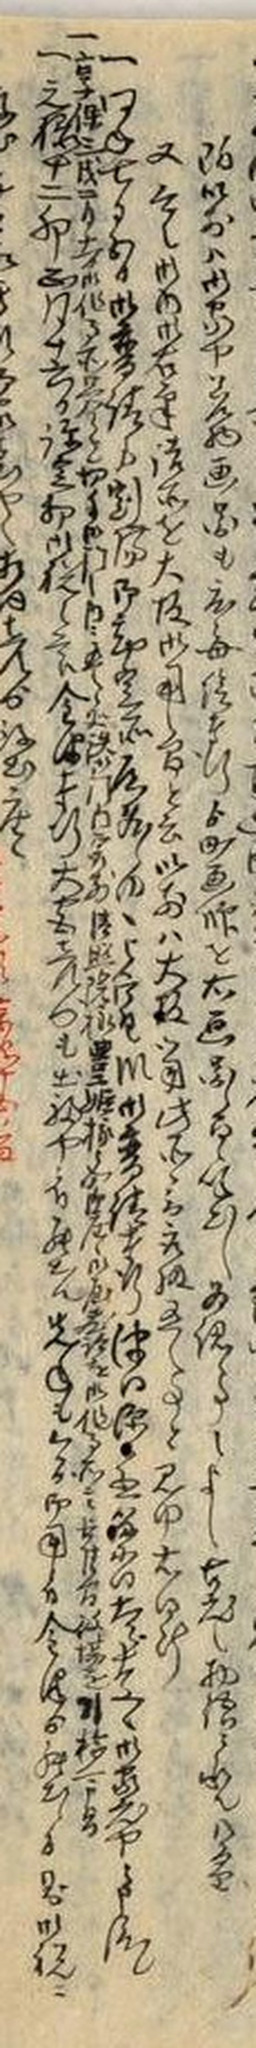一同年七月五日御普請方割場御勘定所屋敷之内へ被仰付候段御普請奉行津田源之丞簗田太郎大夫へ御家老中被申渡候
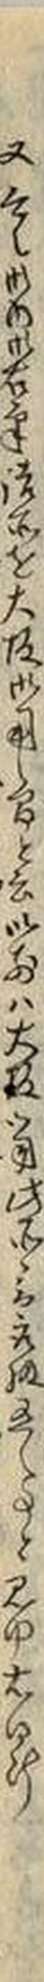又今之御内御右筆詰所を大坂御用之間と云以前は大坂御用此所にて取扱有之候事と見ゆ右同断
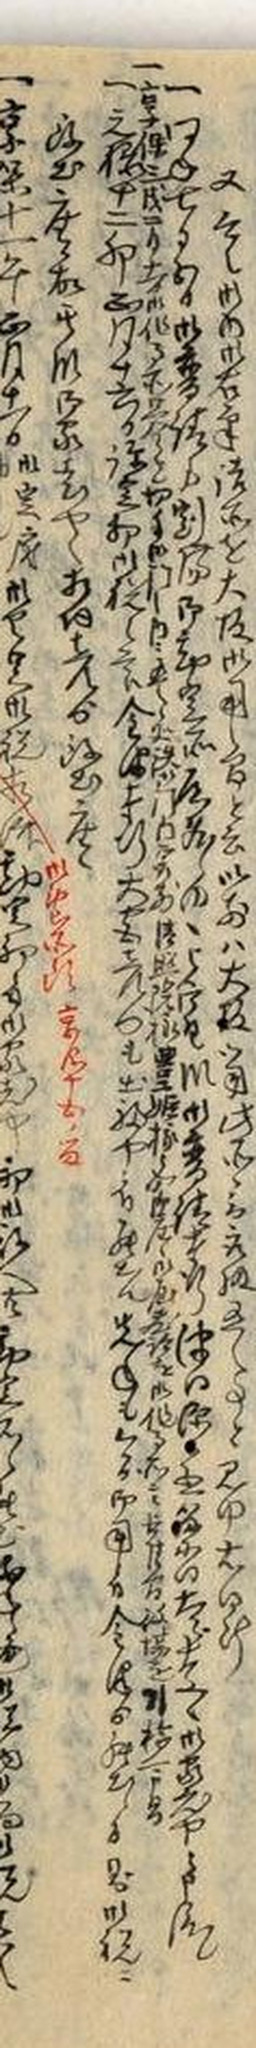一元禄十二卯正月十六日評定初御祝之節金津奉行大宮彦右衛門も出福中に付罷出ル先年も今日御用に付金津ゟ罷出候方則御祝に
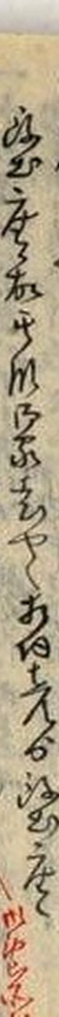致出座候故其段御家老中へ相伺彦右衛門致出座候

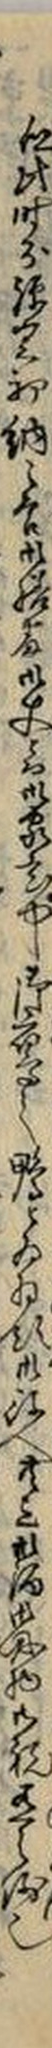但此時分評定初納之節御膳番御使にて御家老中御鷹之鴨被為拝領御役人共迄御酒御吸物御祝有之例也
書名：御城下諸事之部
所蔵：福井県文書館 Fukui Prefectural Archives
